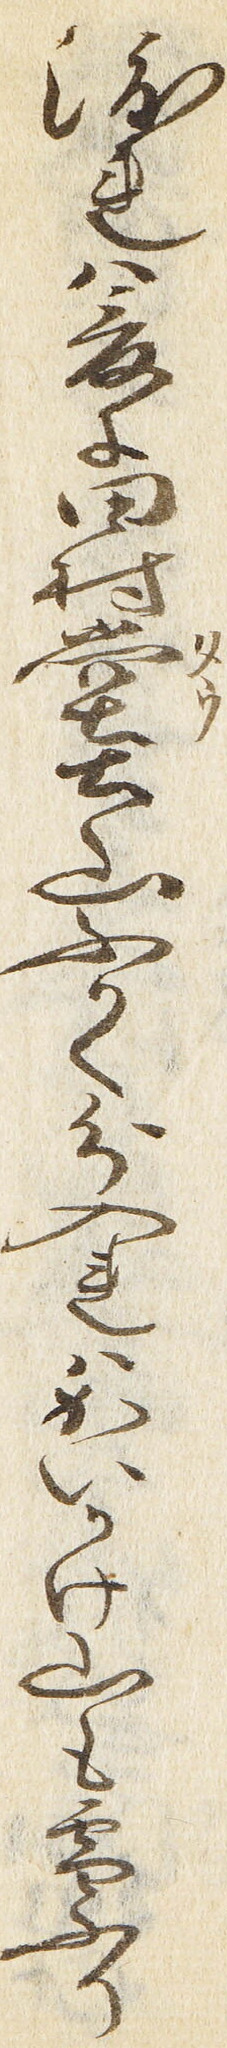渡れは爰に田村堂土山ふかく分入れはかいかけ山も雪ふり
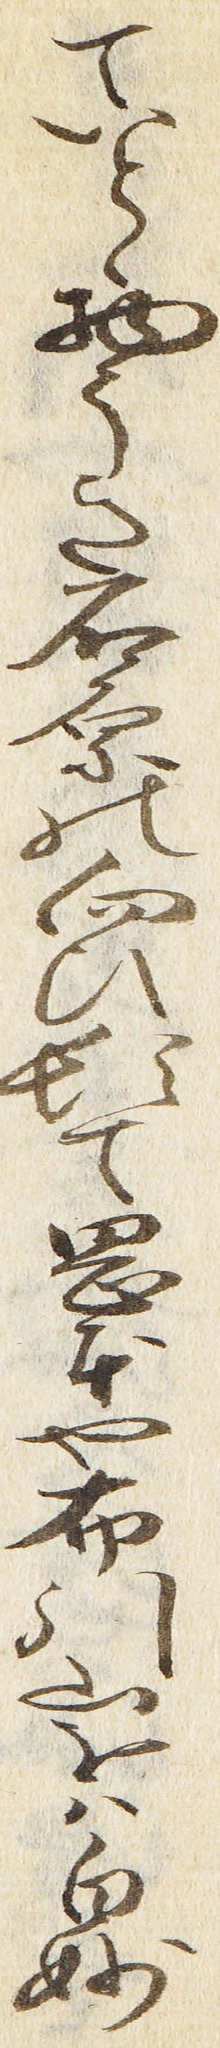ていとゝ物うき石原の向ひ頓て岡本や布引山をは白妙
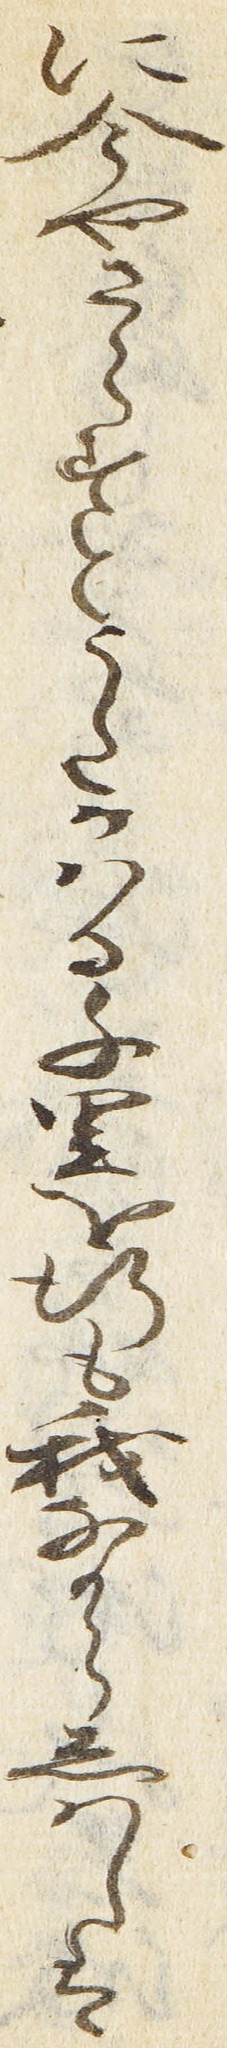に今やさらすとうたかはる千里を行も我なからしはしは
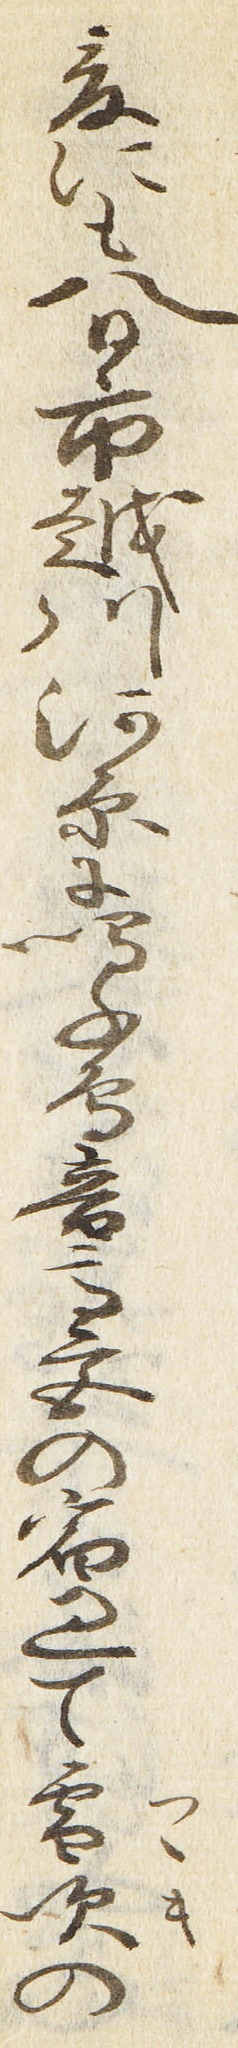爰にも八日市越川河原に鳴千鳥音高宮の宿過て雪吹の
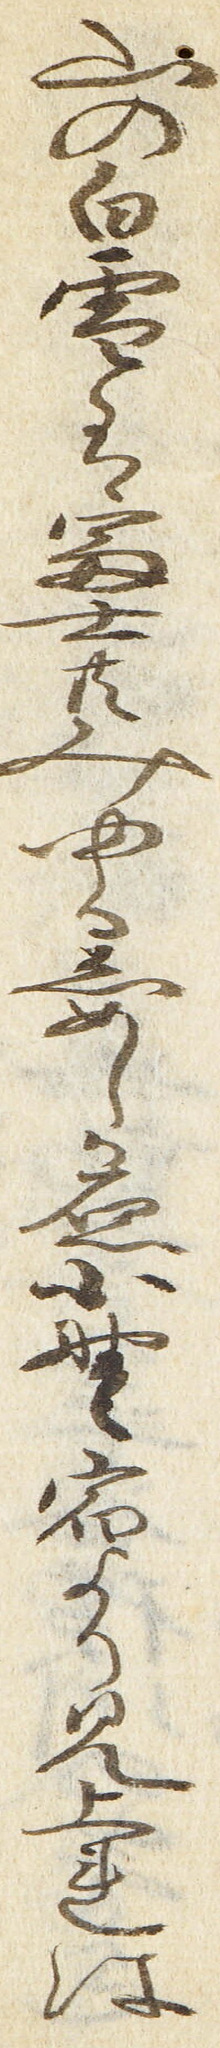山の白雪は富士共みゆるしめしか原小野の宿より見上れは
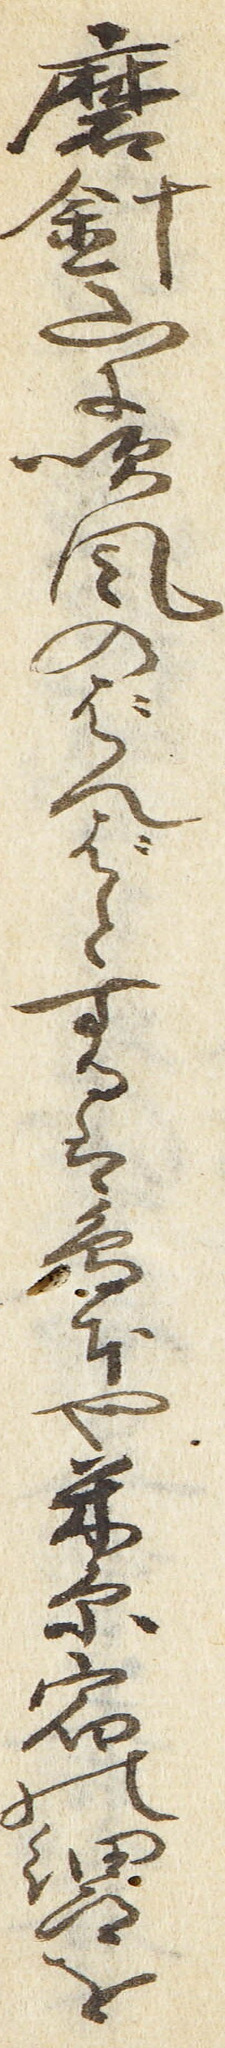磨針山に吹風のばんばとするは鳥本や米原宿の細道を

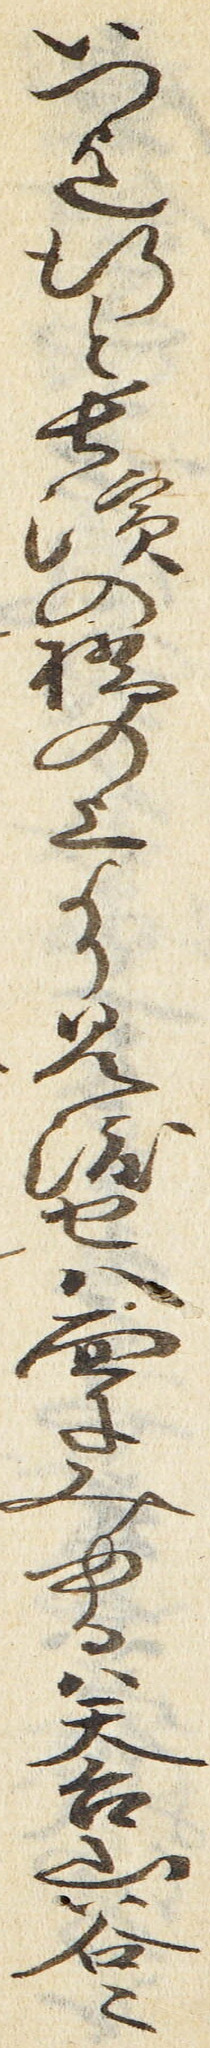ゞつ迄行と長浜の橋の上より見渡せは面にみゆるは天台山谷々
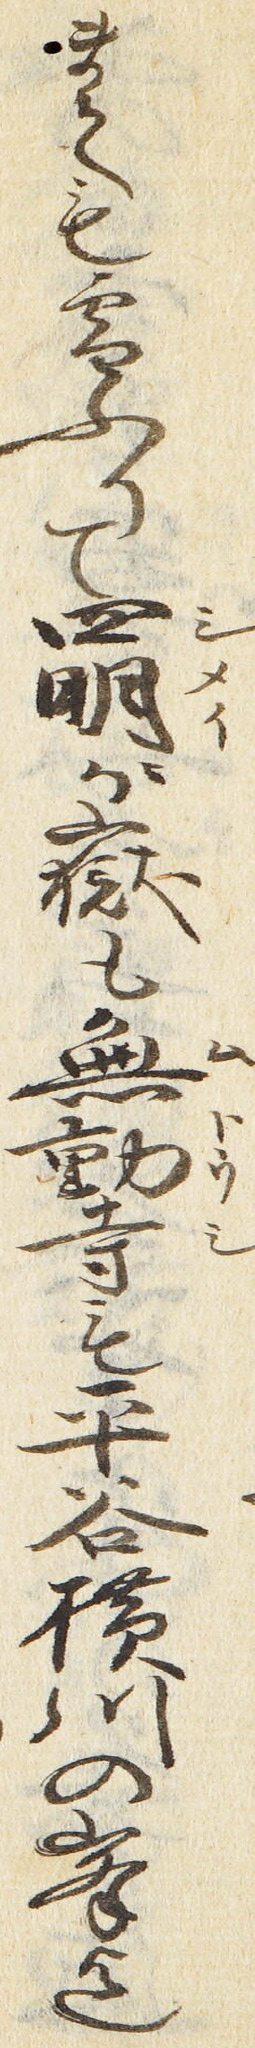まても雪ふりて四明が嶽も無動寺も平谷横川の峯迄
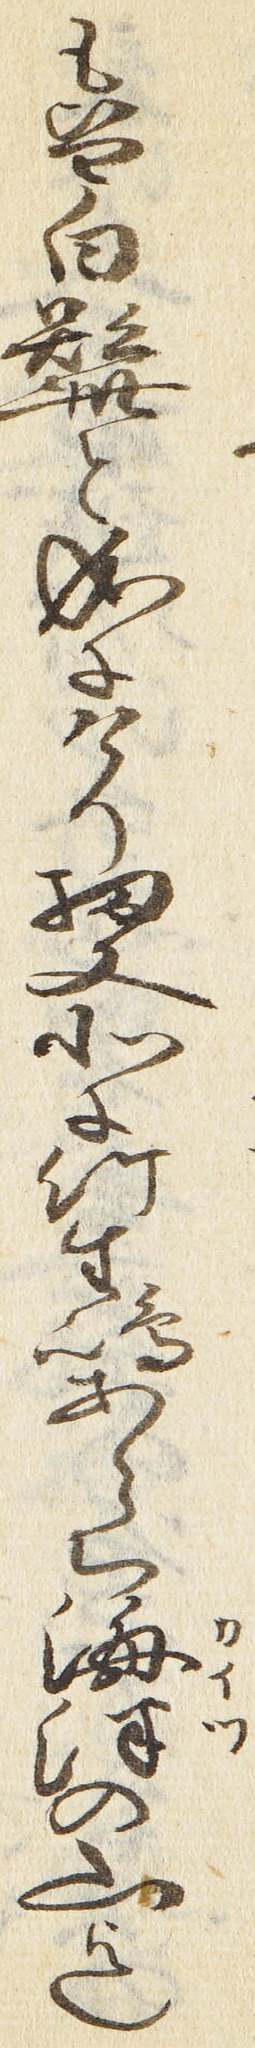も皆白髭と成にけり扨又北に竹生島あらち海津の山迄
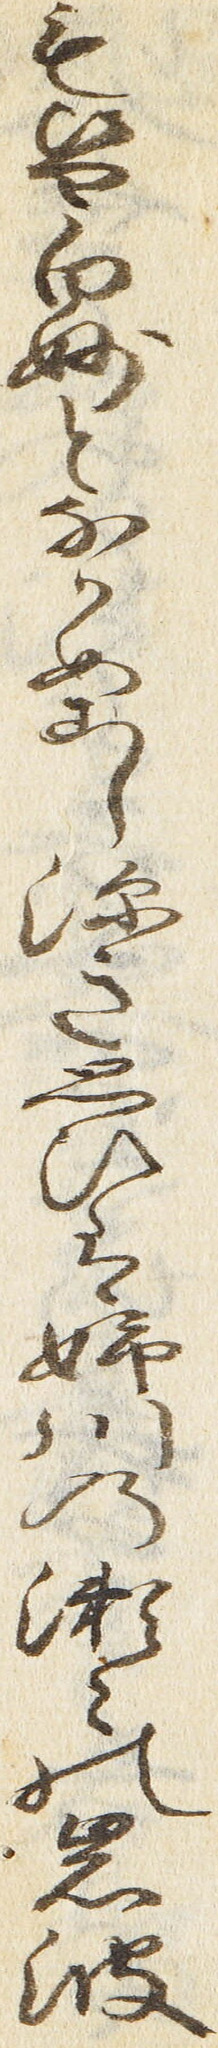も皆白妙となかめこし深き思ひは姉川の瀬々の岩波
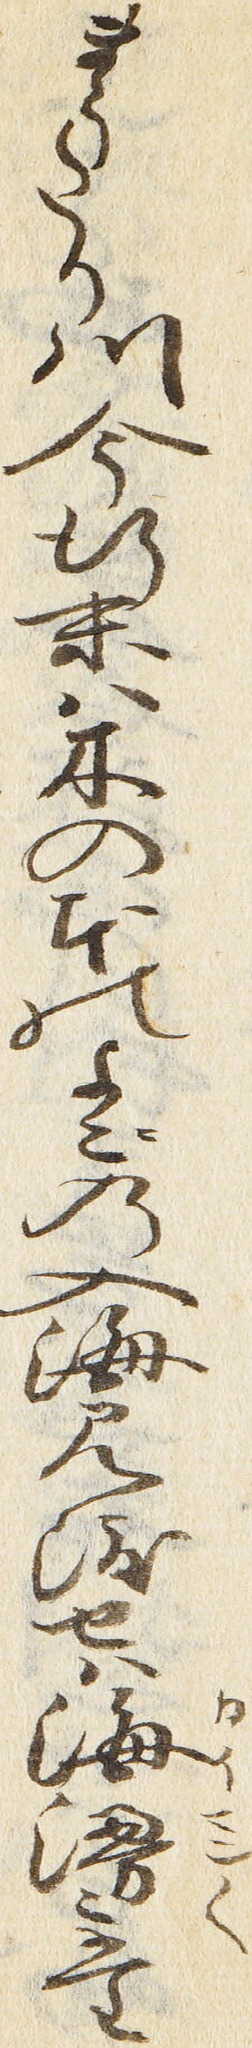まうたり川今行末は木の本のよごの入海見渡せは海漫々た
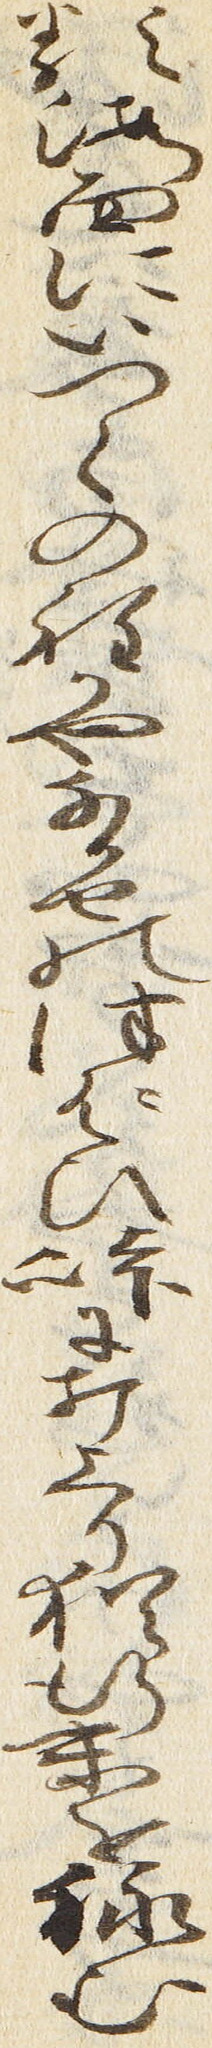る海面にいつくの程かやなかせの津ばひ峠に打上り猶行末を詠む
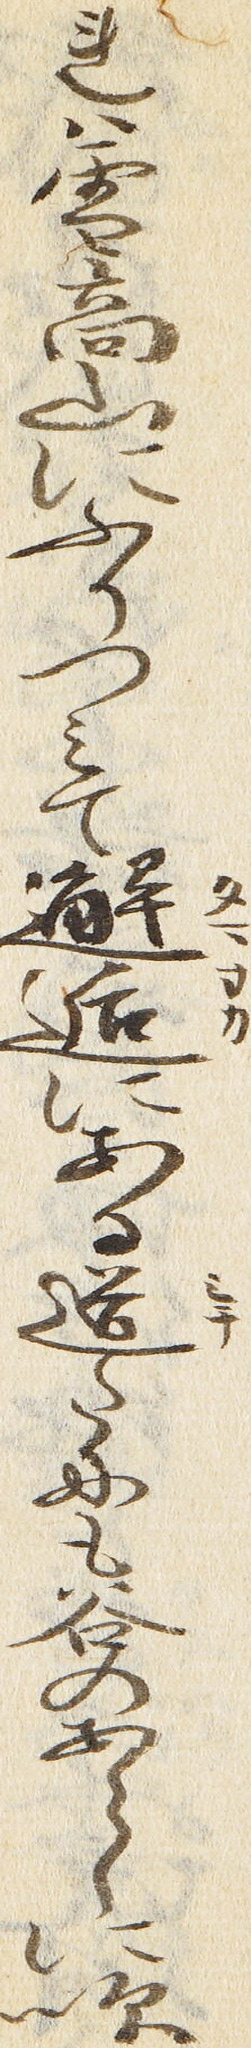れは雪高山にふりつみて邂逅にある道たにも谷のあらしに吹
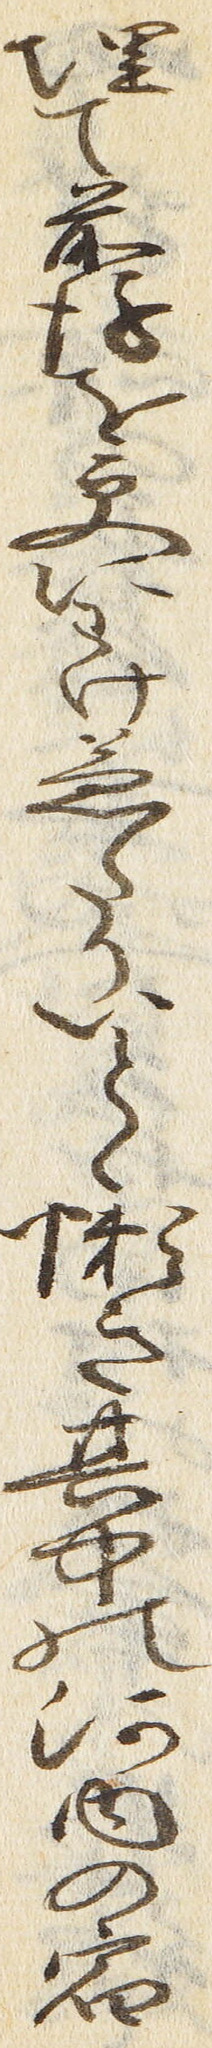埋て前後を更にわけ兼たりいとゝ懶き其中の河内の宿
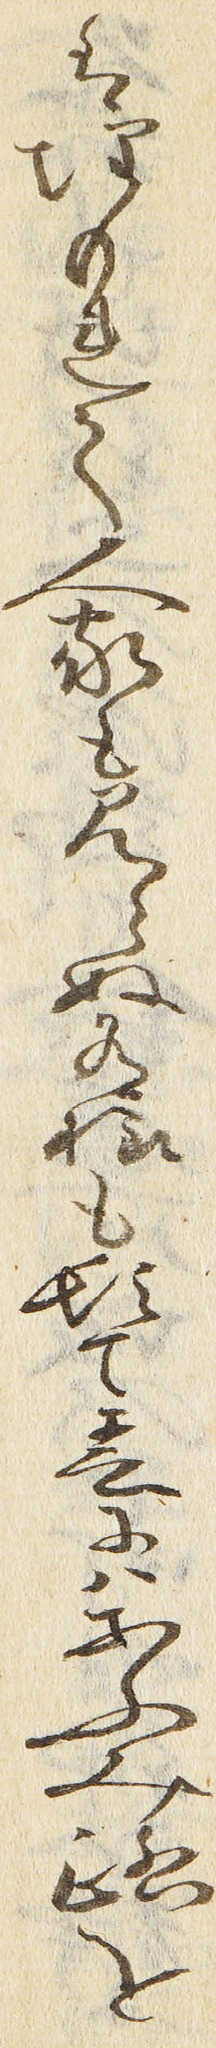は埋もれて人家も見えぬ有様も頓て春にはあふみ路を
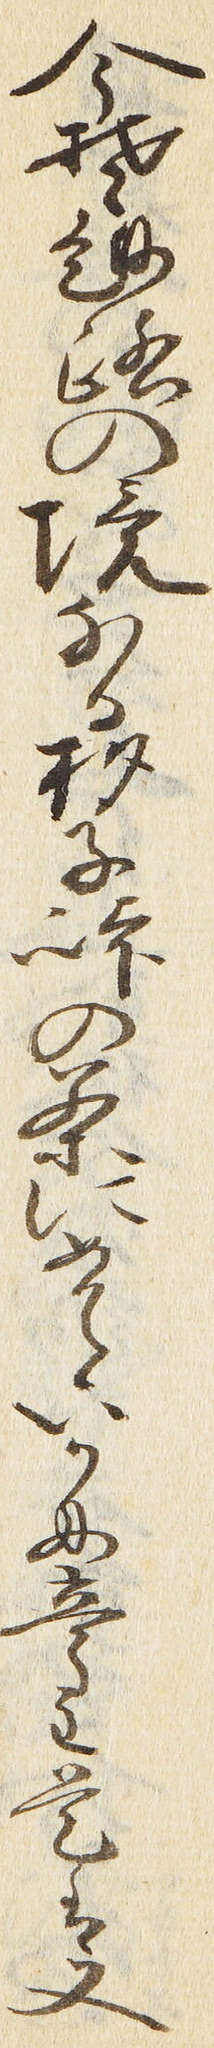今そ越路の境なる杓子峠の茶にめてゝいかに亭主是は又
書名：海陸世話日記
